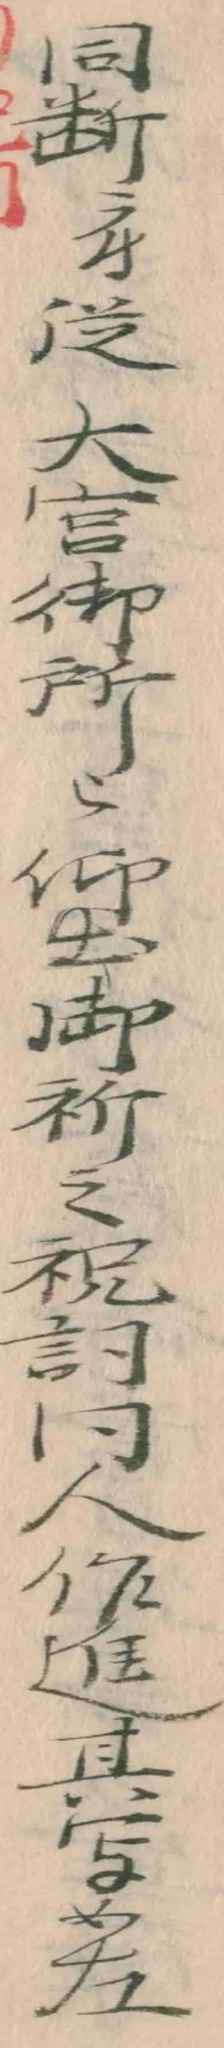同断ニ付従大宮御所被仰出御祈之祝詞同人作進其写如左
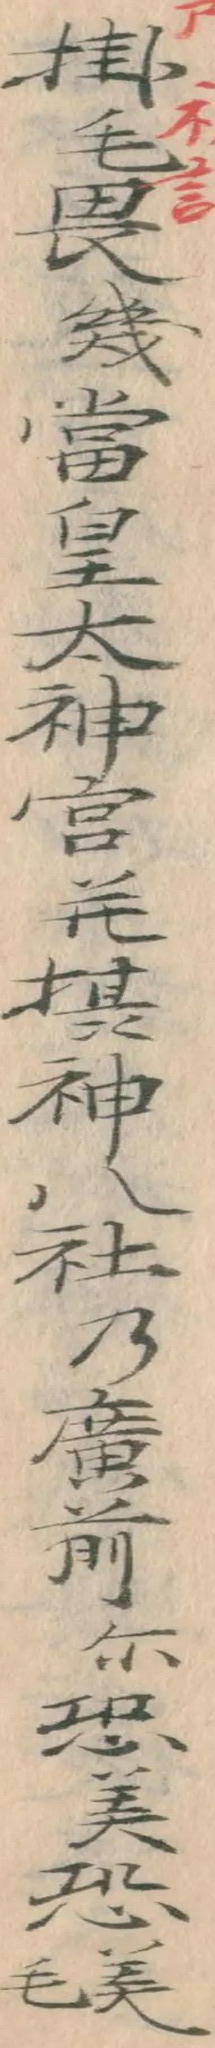掛毛畏幾當皇太神宮并摂神八社乃廣前尓恐美恐美毛
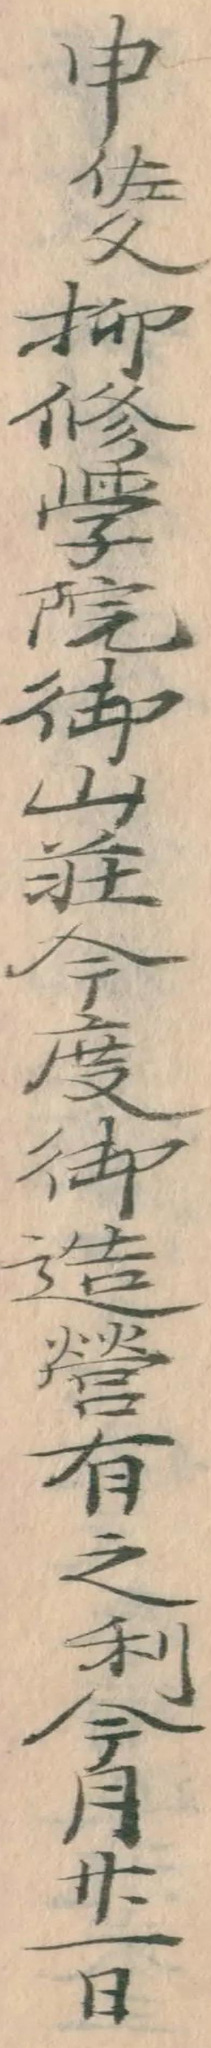申渡久抑修學院御山荘今度御造営有之未今月廿一日

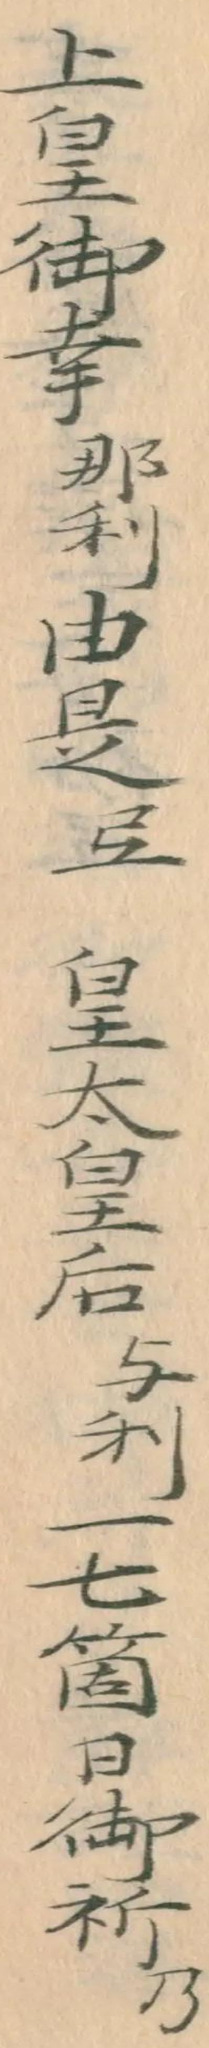上皇御幸那利由是弖皇太皇后与利一七箇日御祈乃
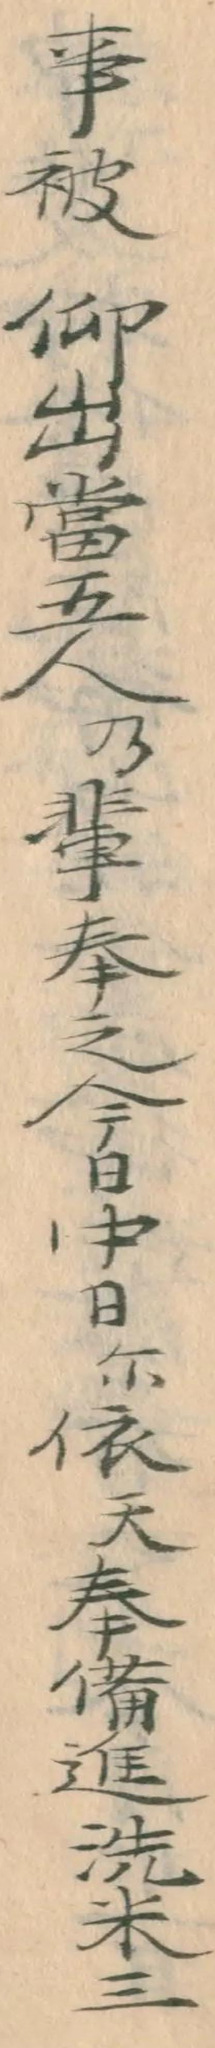事被仰出當五人乃輩奉之今日中日尓依天奉備進洗米三
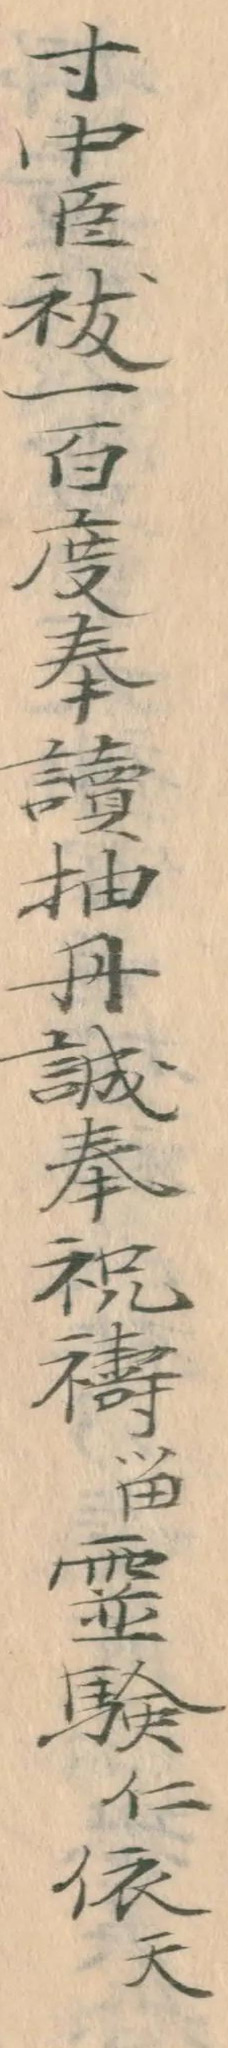寸中臣祓一百度奉讀抽丹誠奉祝祷留霊験仁依天
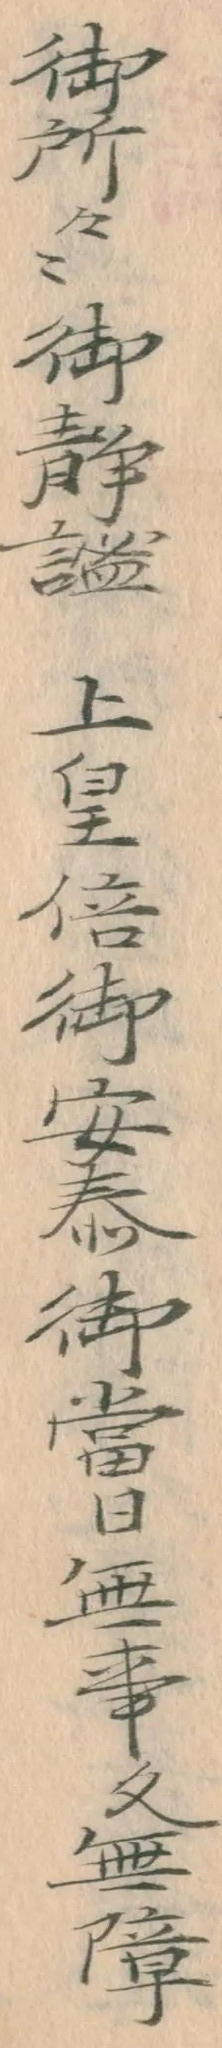御所々々御静謐上皇倍御安泰御當日無事久無障
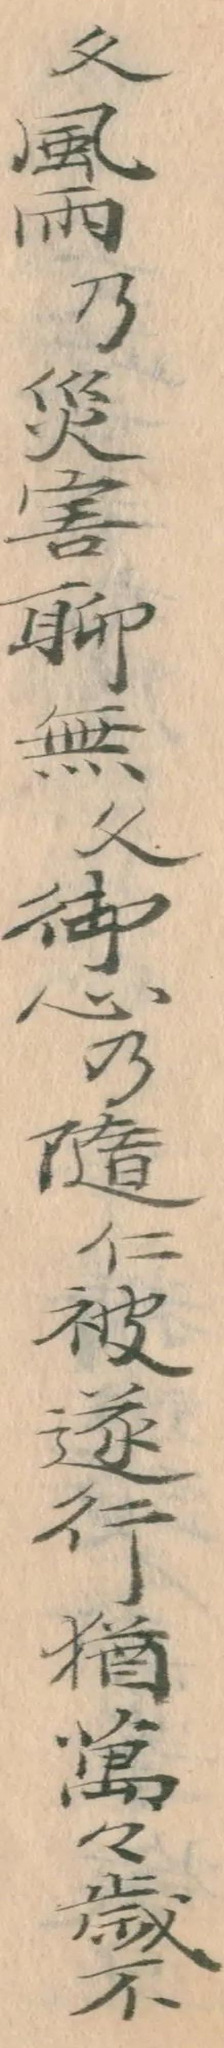久風雨乃災害聊無久御心乃随仁被遂行猶萬々歳不
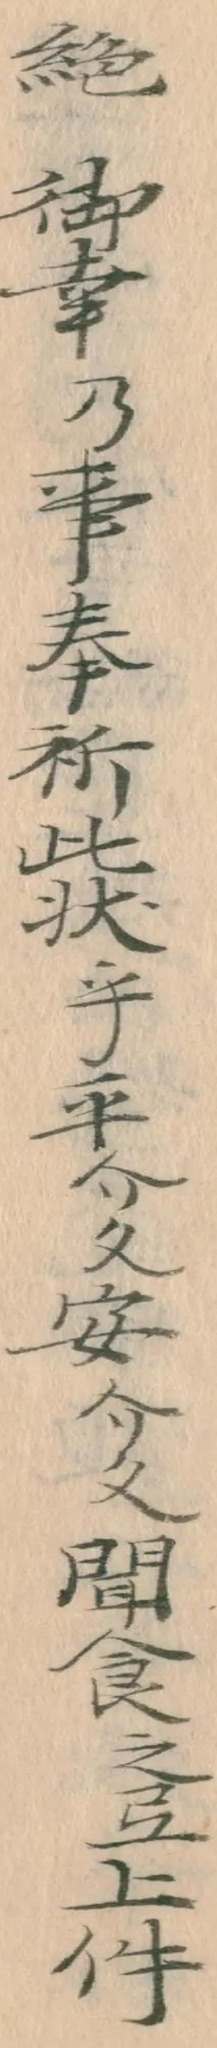絶御幸乃事奉祈此状乎平介久安介文聞食之弖上件
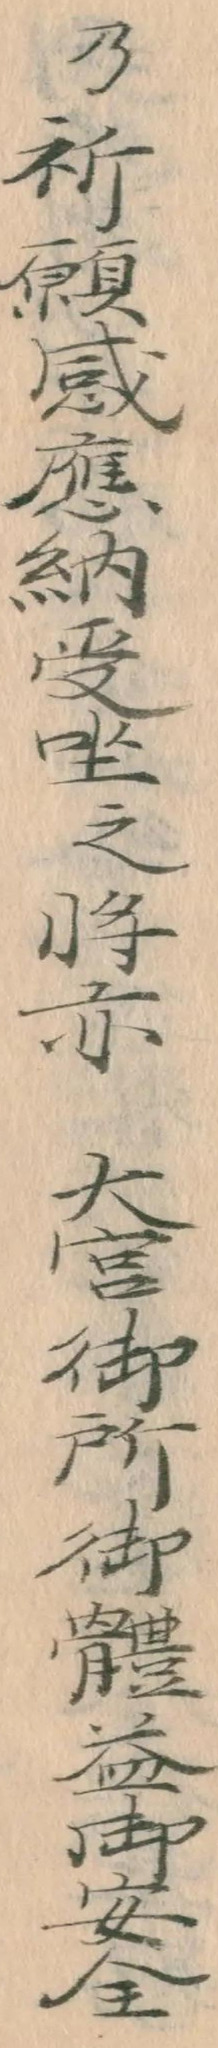乃祈願感應納受坐之将亦大宮御所御體益御安全
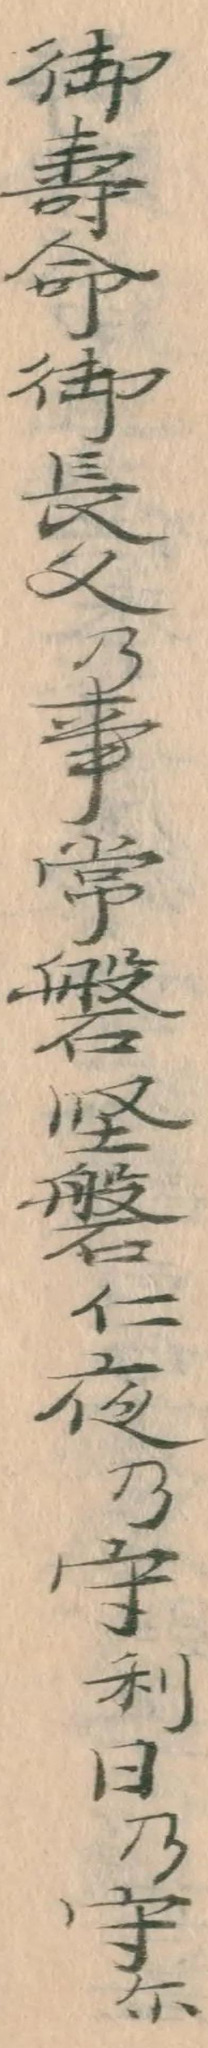御壽命御長久乃事常磐堅磐仁夜乃守利日乃守尓
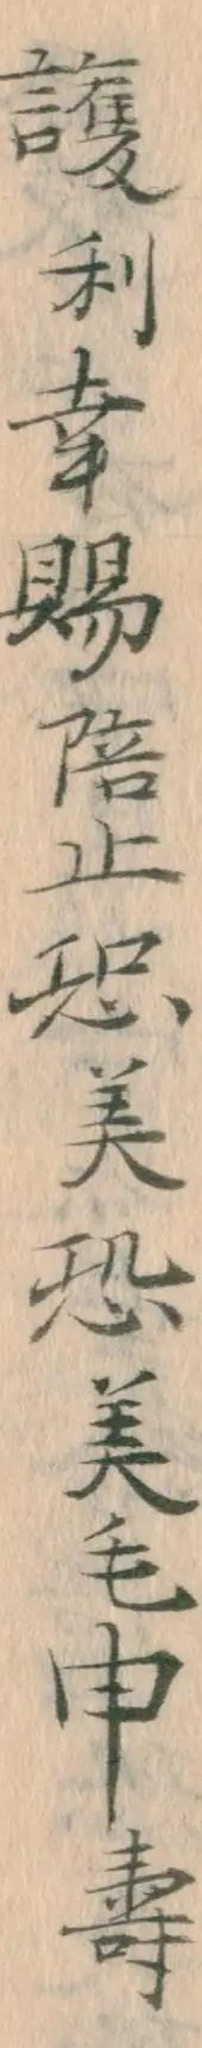護利幸賜陪止恐美恐美毛申壽
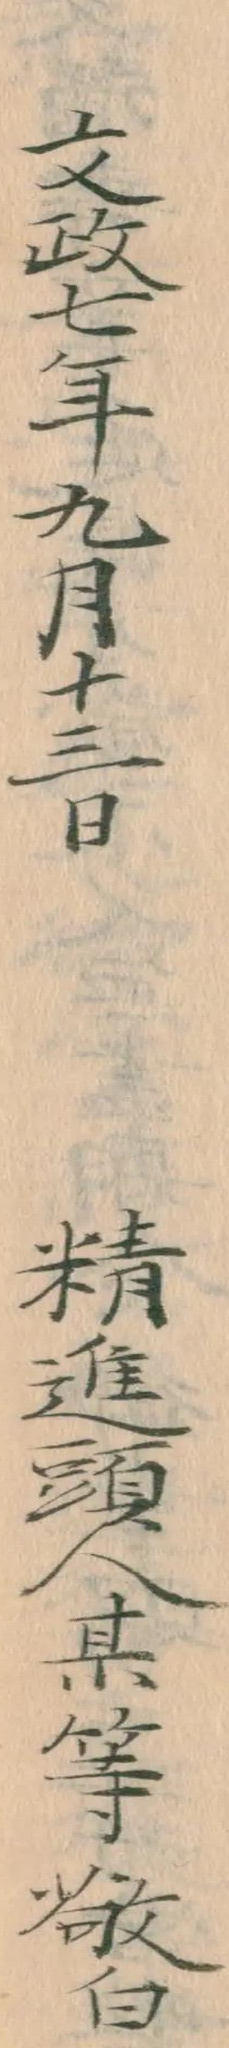文政七年九月十三日精進頭人某等敬白
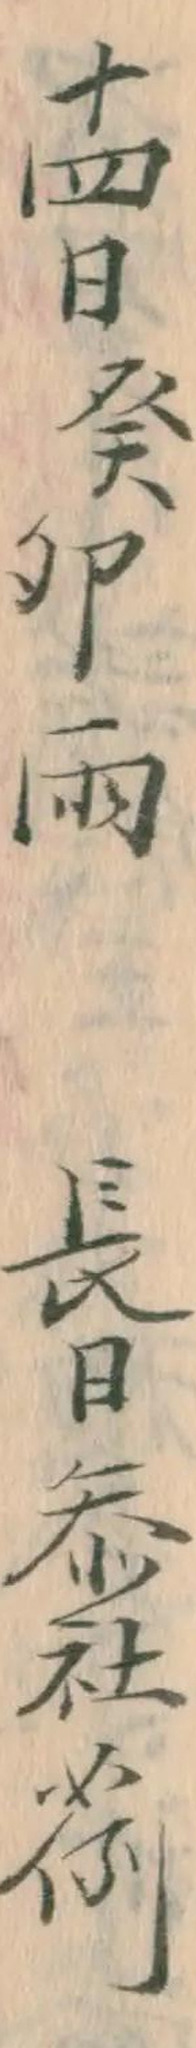十四日癸卯雨長日参社如例
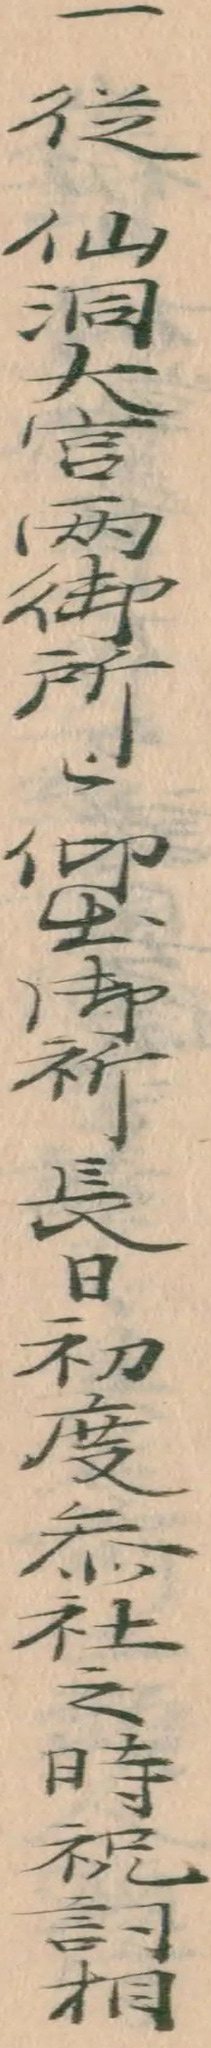一従仙洞大宮両御所被仰出御祈長日初度参社之時祝詞相
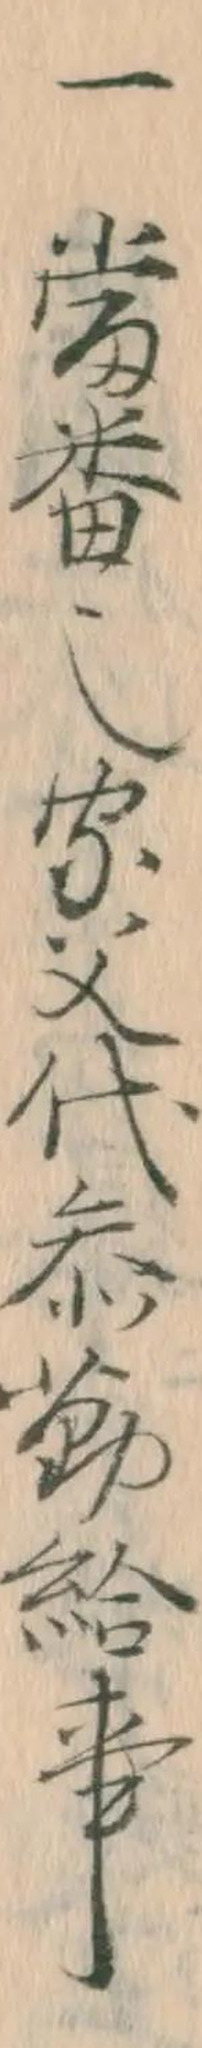一當番也家父代参勤給事
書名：賀茂社記録. 第74冊
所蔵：国立国会図書館 National Diet Library, JAPAN
